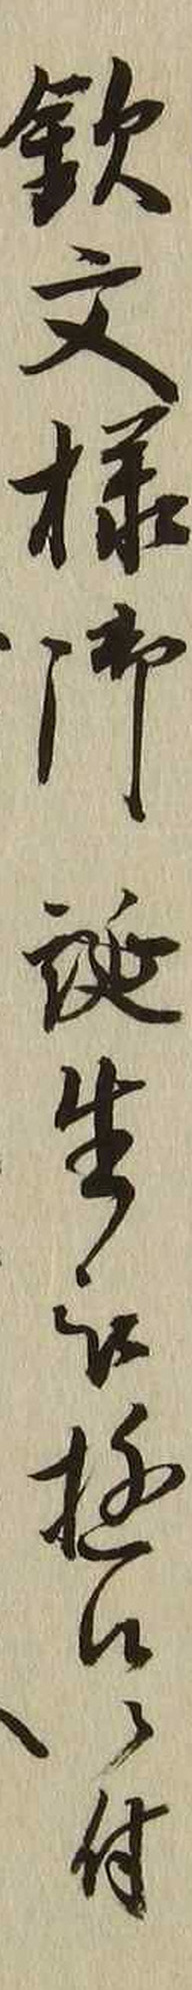欽文様御誕生被遊候ニ付
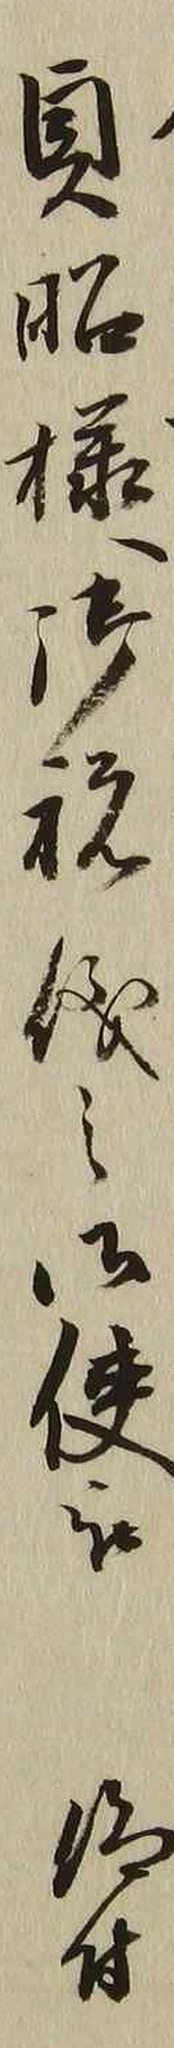貞昭様へ御悦儀之御使被仰付
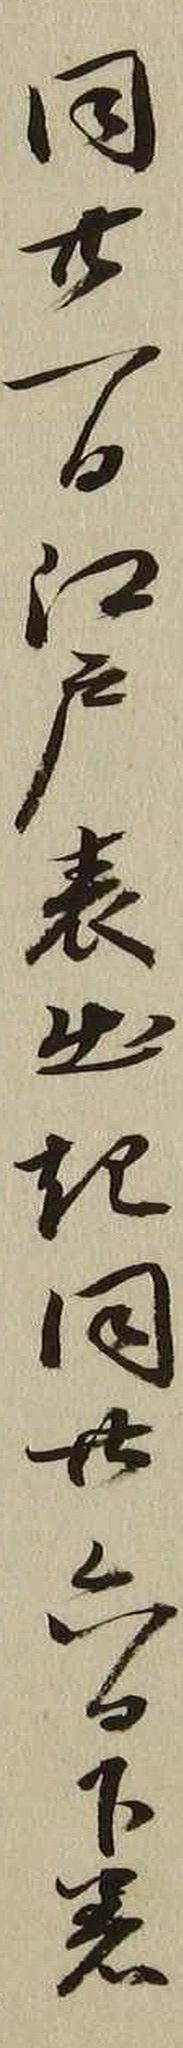同廿一日江戸表出起同廿六日下着
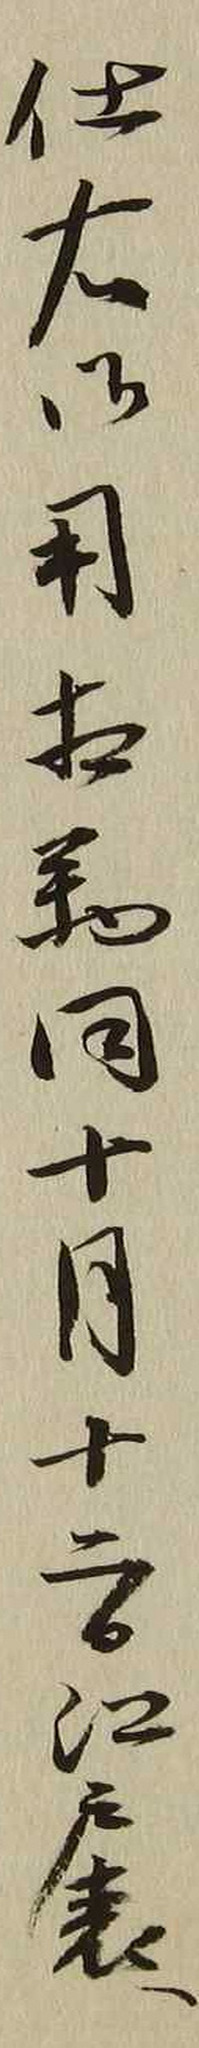仕右御用相勤同十月十二日江戸表へ
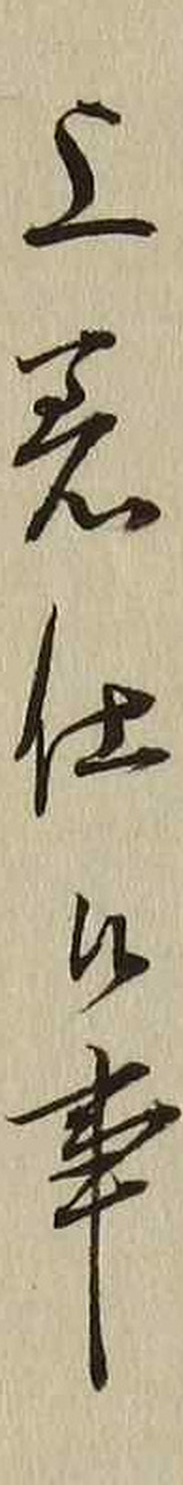上着仕候事
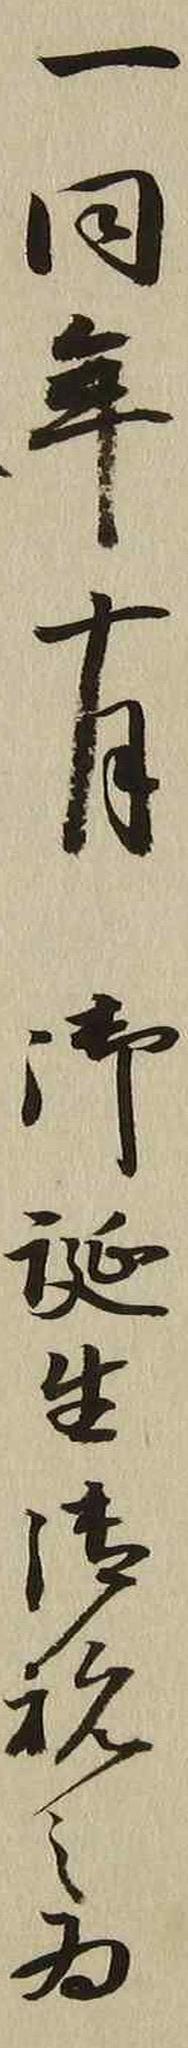一同年十月御誕生御悦之為
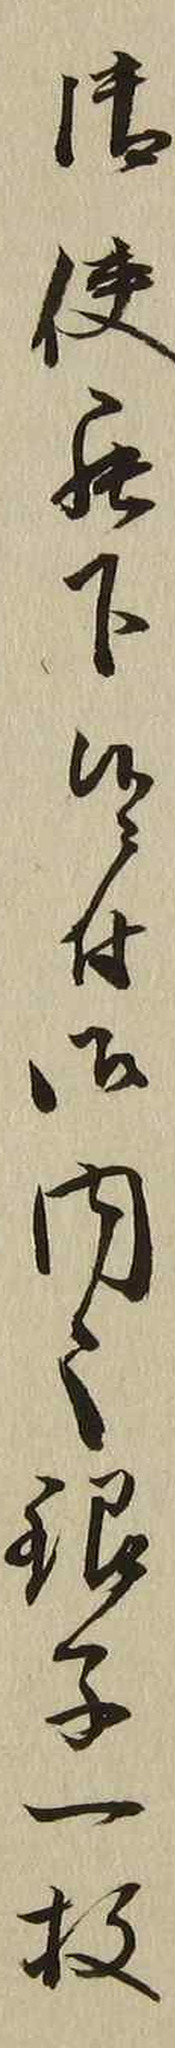御使罷下候ニ付御内々銀子一枚
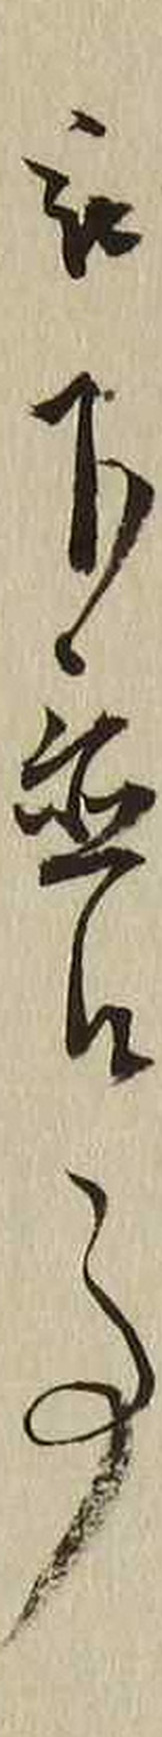被下置候事
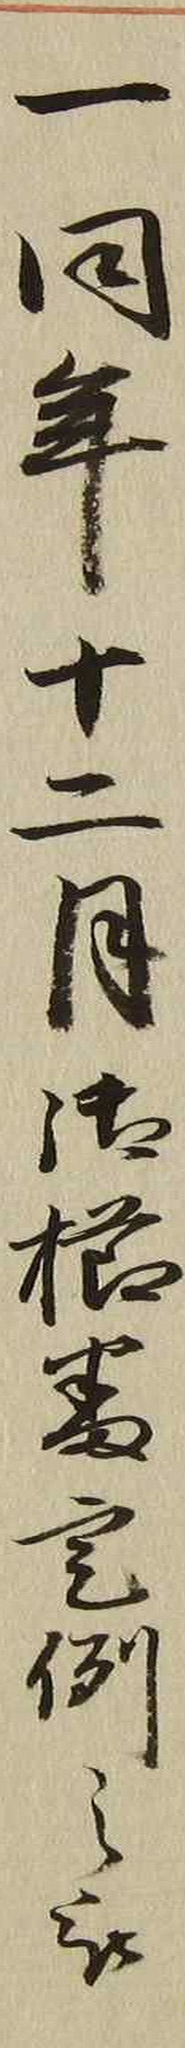一同年十二月御櫛番定例之被
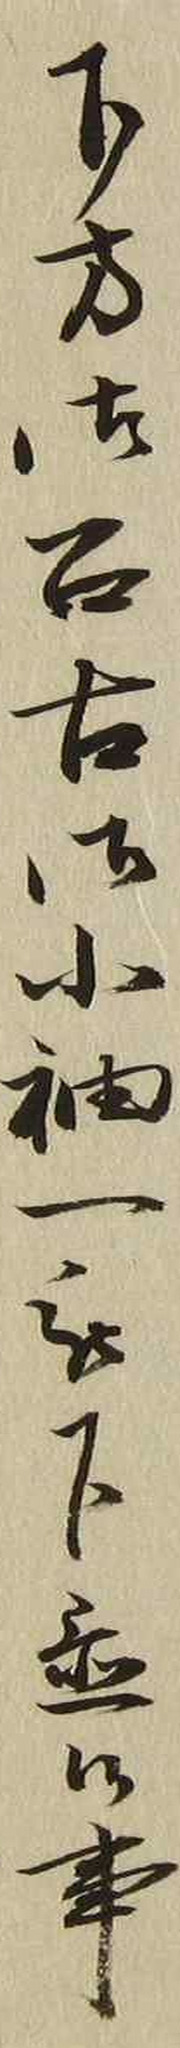下方御召古御小袖一被下置候事
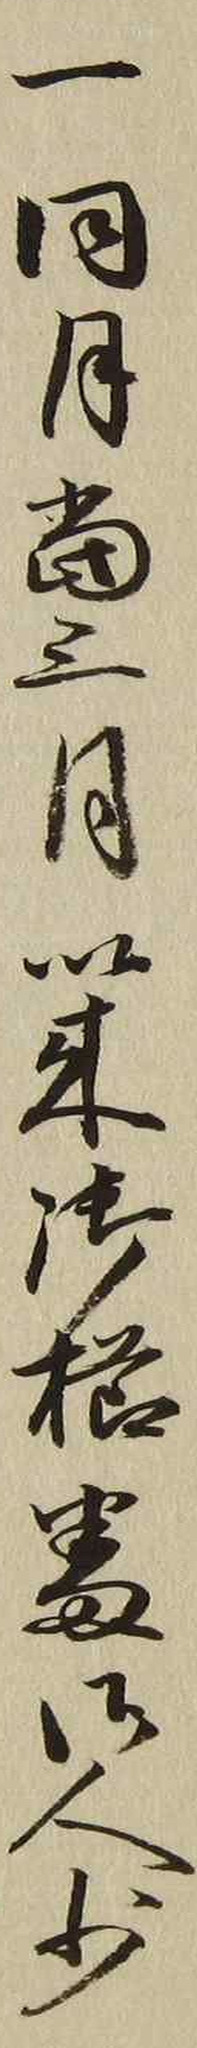一同月当三月以来御櫛番御人少
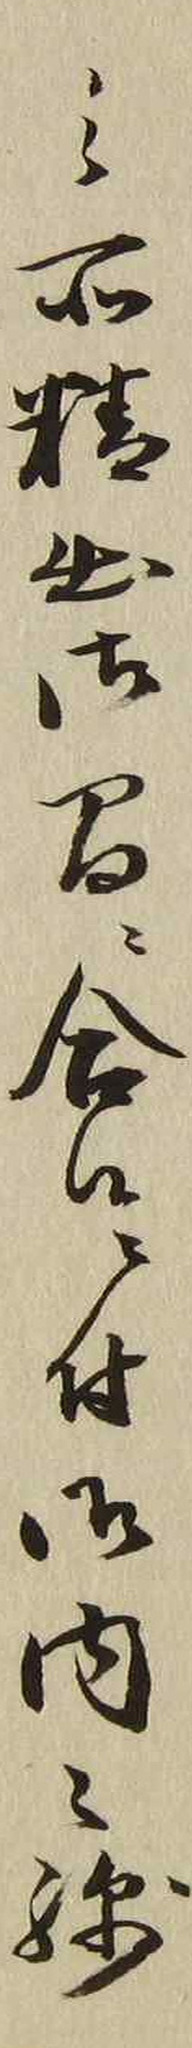之所精出御間ニ合候ニ付御内々綿
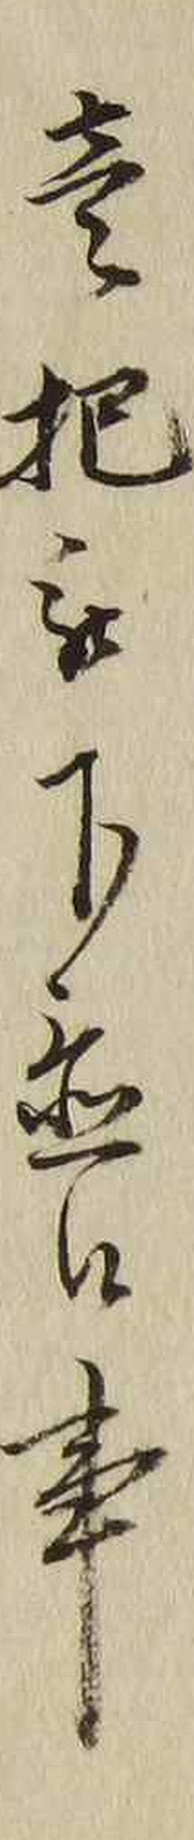壱把被下置候事
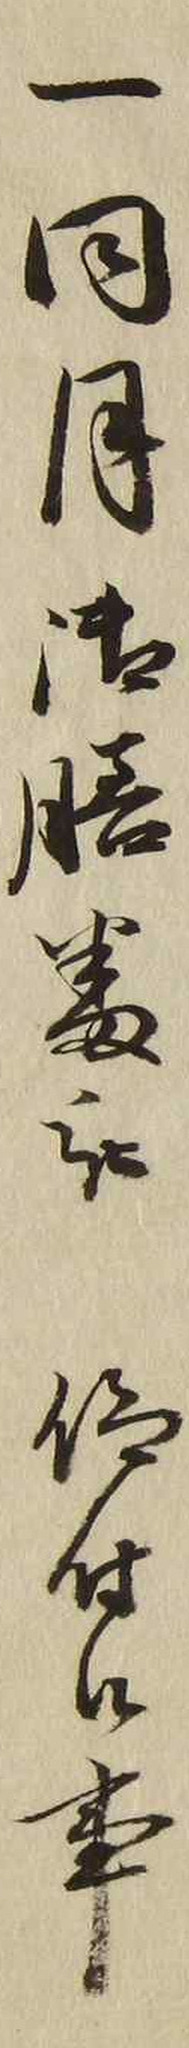一同月御膳番被仰付候事
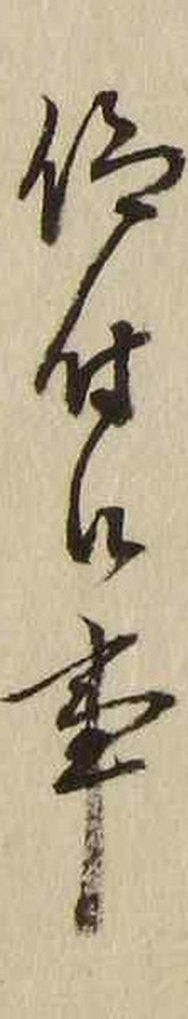仰出候事

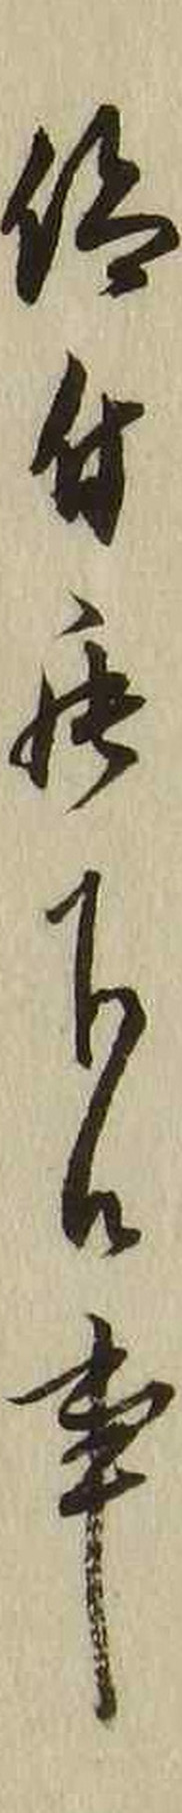仰付罷下候事
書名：諸士系譜　巻之61　と之部4
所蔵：会津若松市立会津図書館
